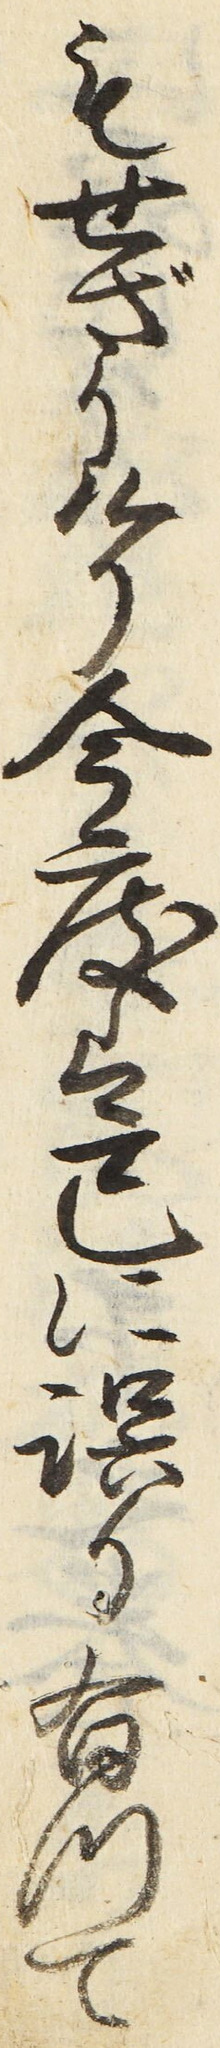もせざりけり今度は已に誤り有つて
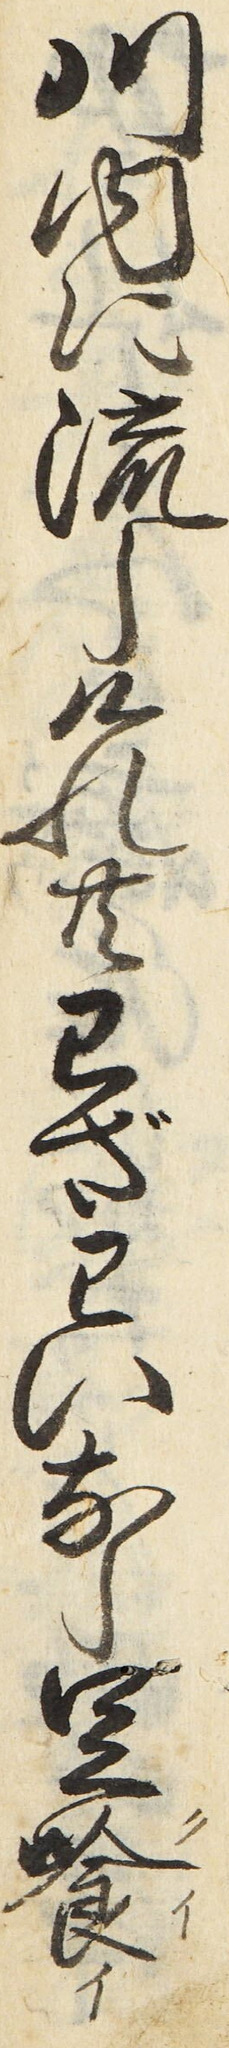川内に流しけれ共わざわひなし足喰い

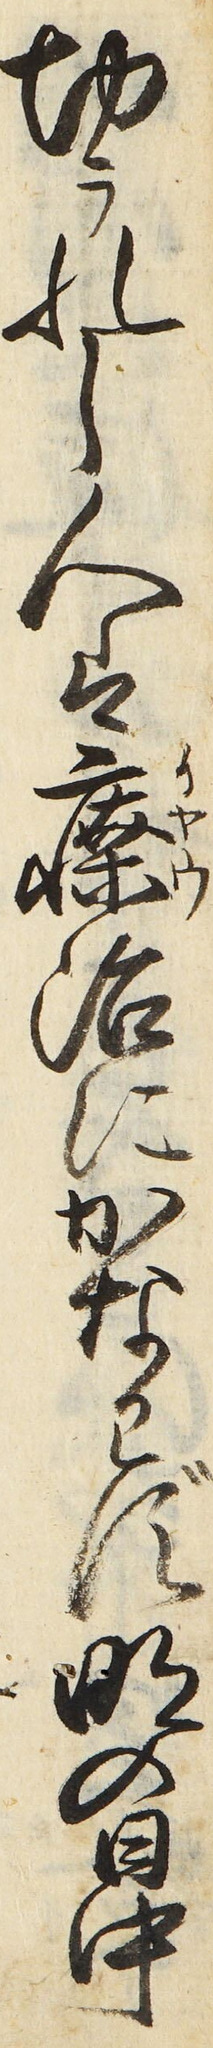切られし人は療治にかなわず明の日中
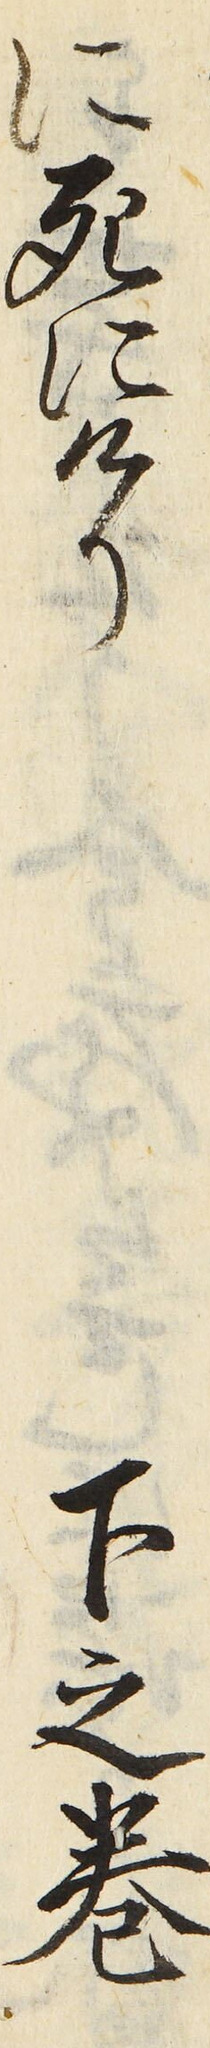に死にけり下の巻
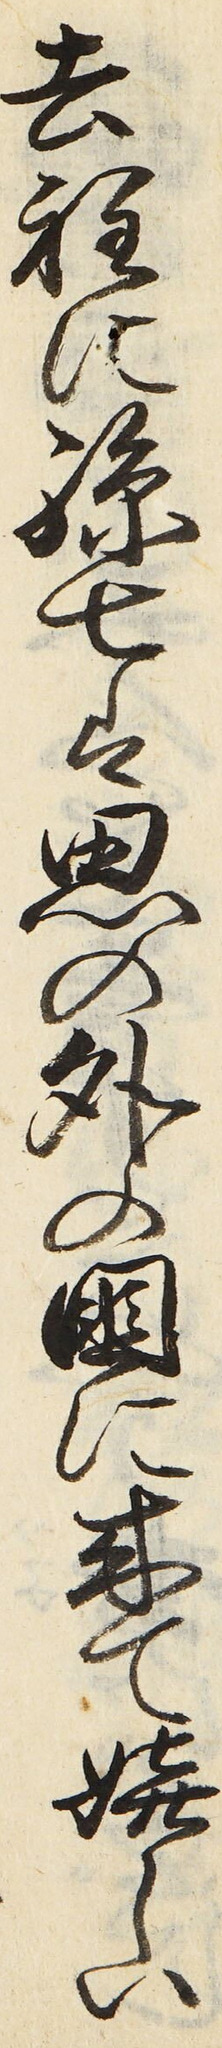去程に孫七は思の外の国に来て嬉しい
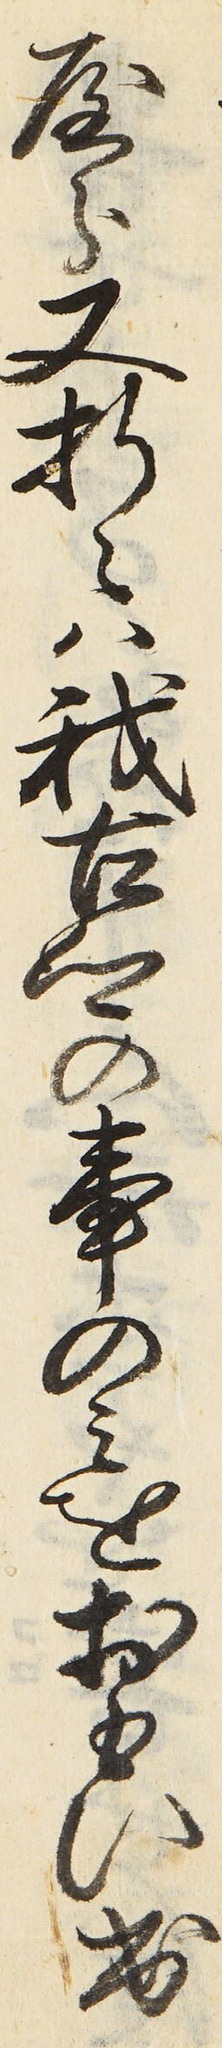やら又折々は我古郷の事のみをおもひ出
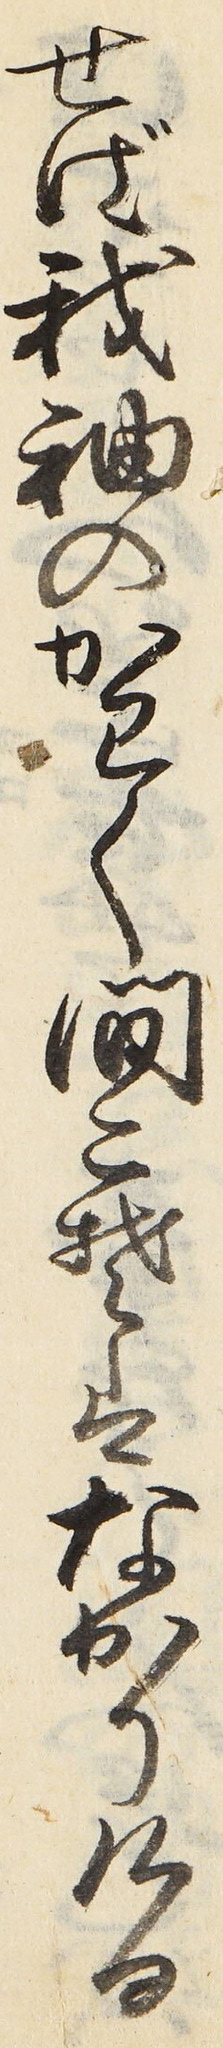せば我袖のかわく間こそはなかりける
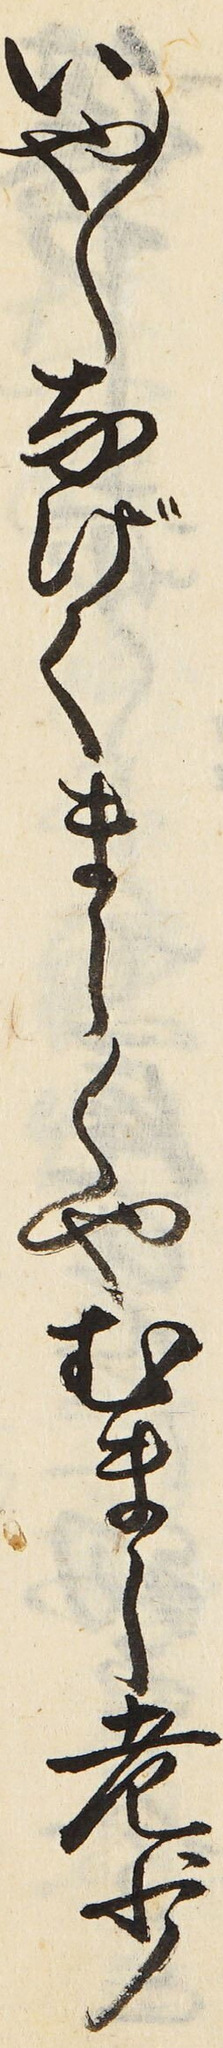いや〳〵なげくましくやむまし老少
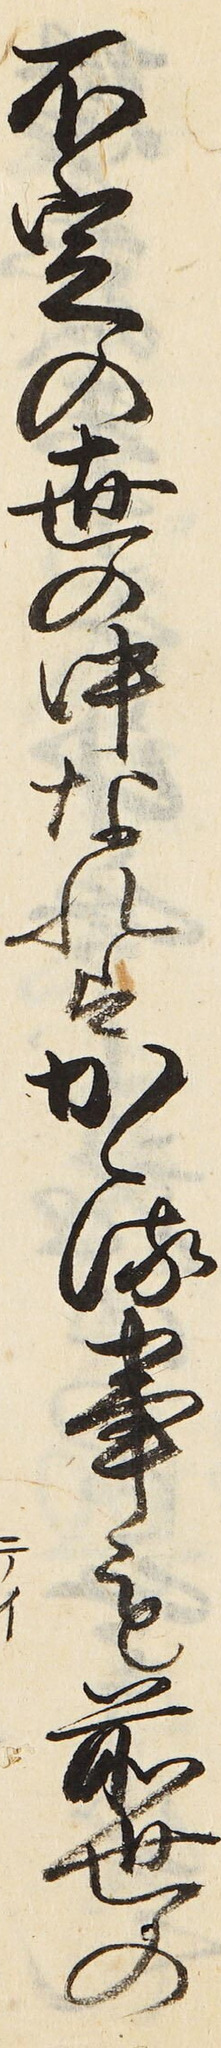不定の世の中なれはかゝる事も前世の
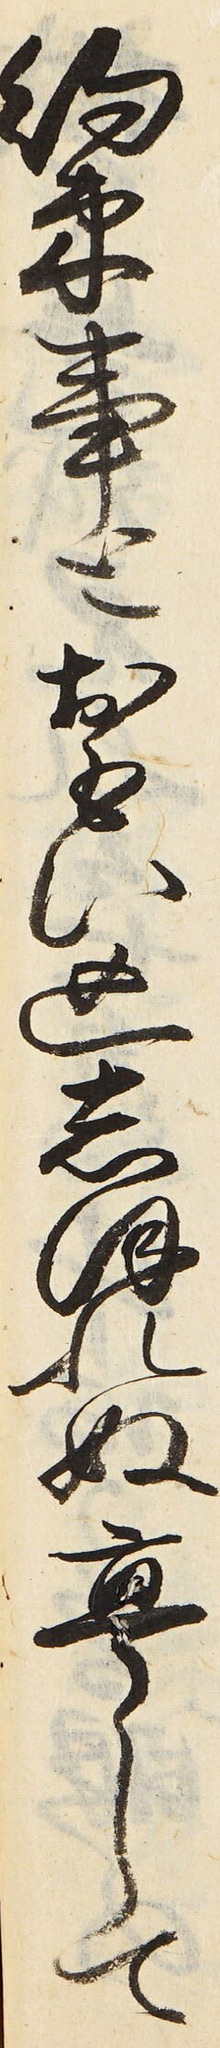約束事とおもひ込しほれぬ亭して
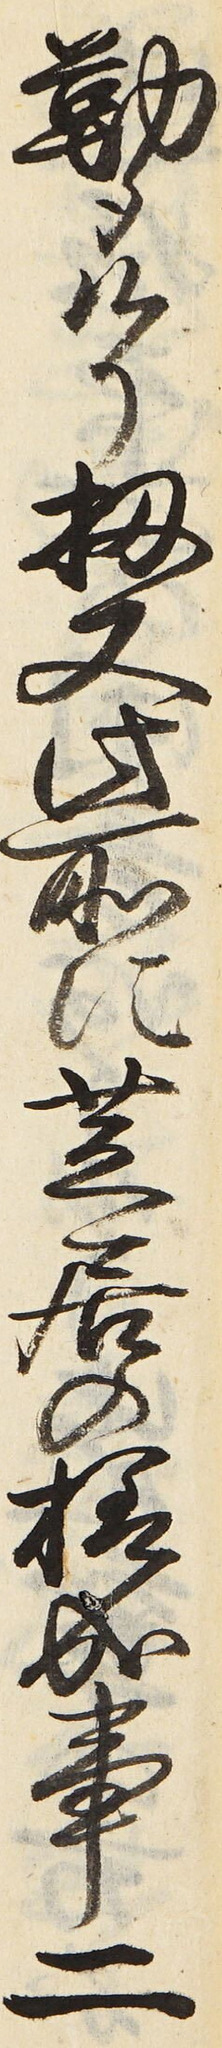勤めけり扨又此所に芝居の様成事二
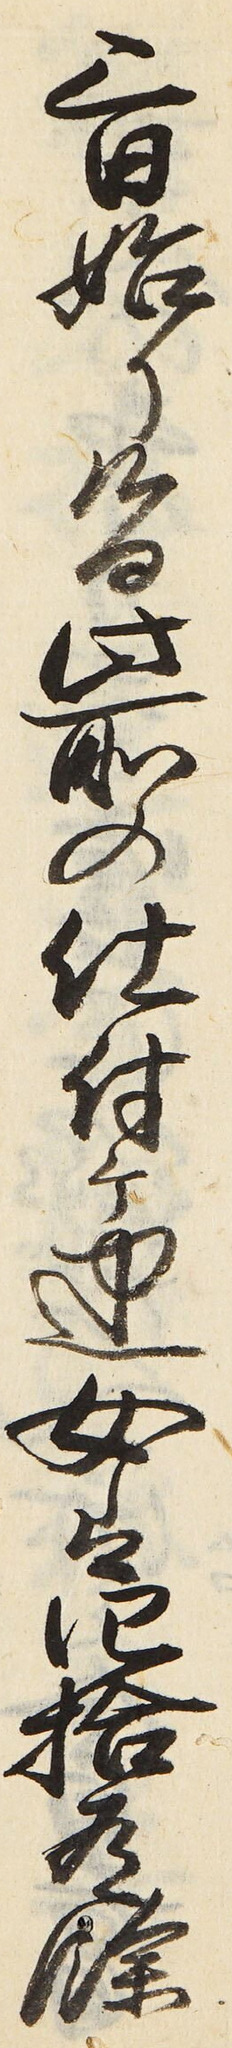三日始りける此所の仕付け迚女は四拾有余
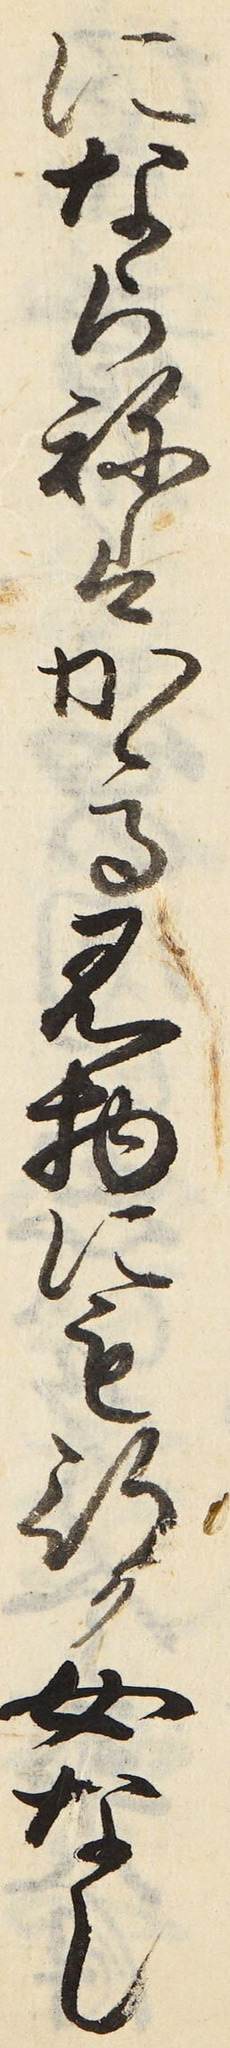にならねはかゝる見物にも行く女なし
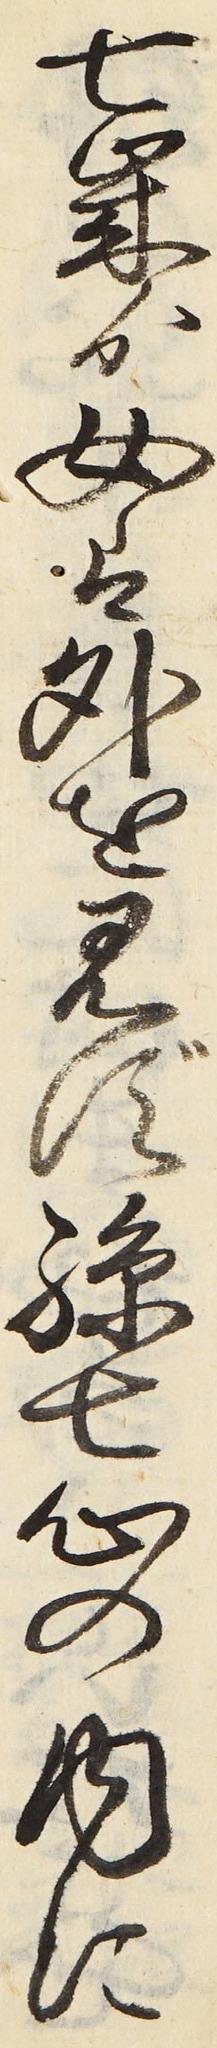七歳ゟ女は外を見ず孫七心の内に
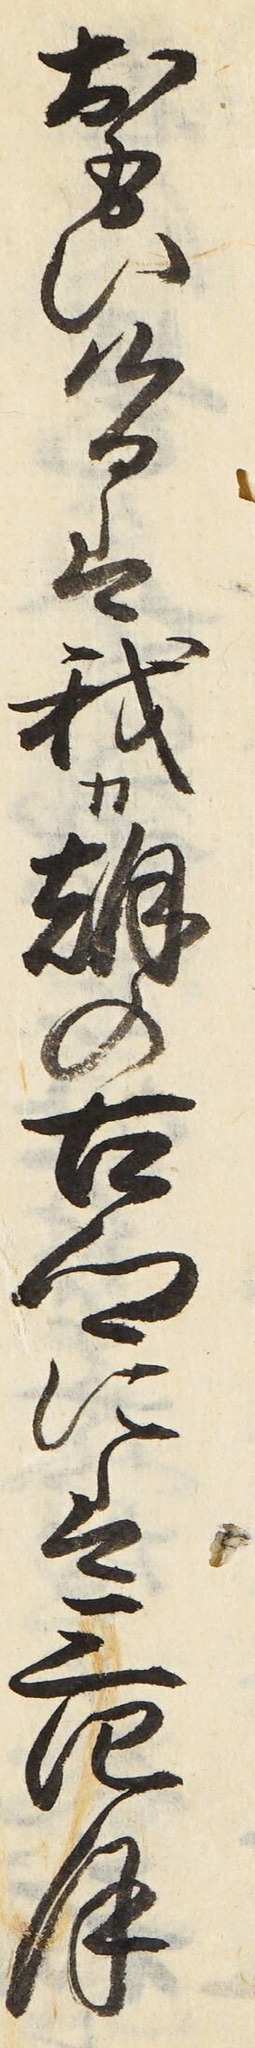おもひけるは我か朝の古郷には三四月
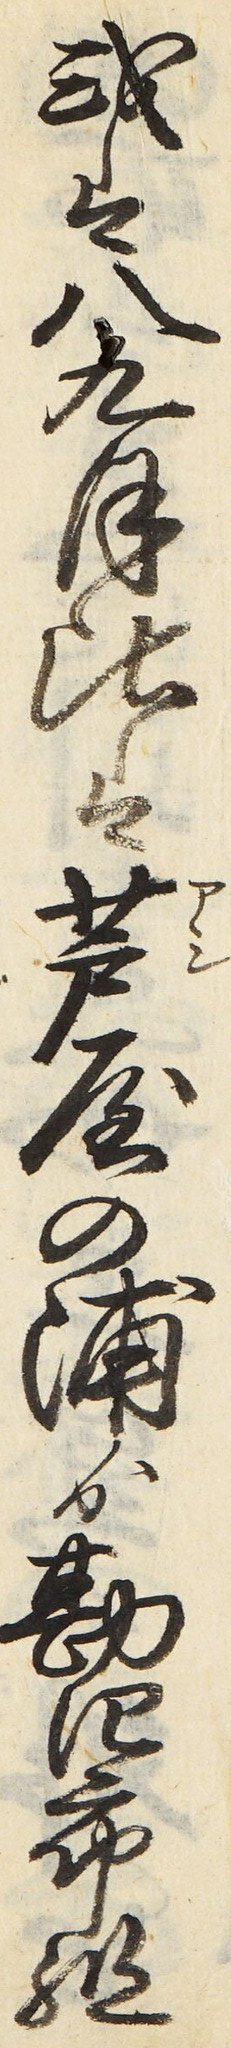或は八九月頃は芦屋の浦ゟ勘四郎組
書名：華夷九年録
